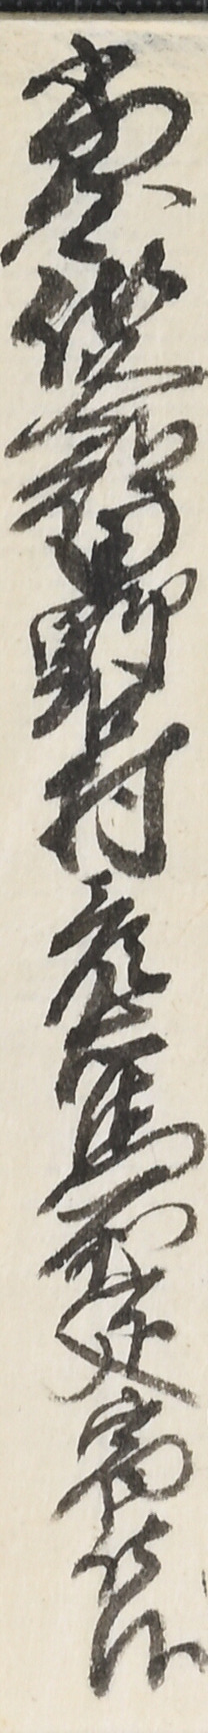当国佐久郡田野口村彦右衛門所定宿仕候
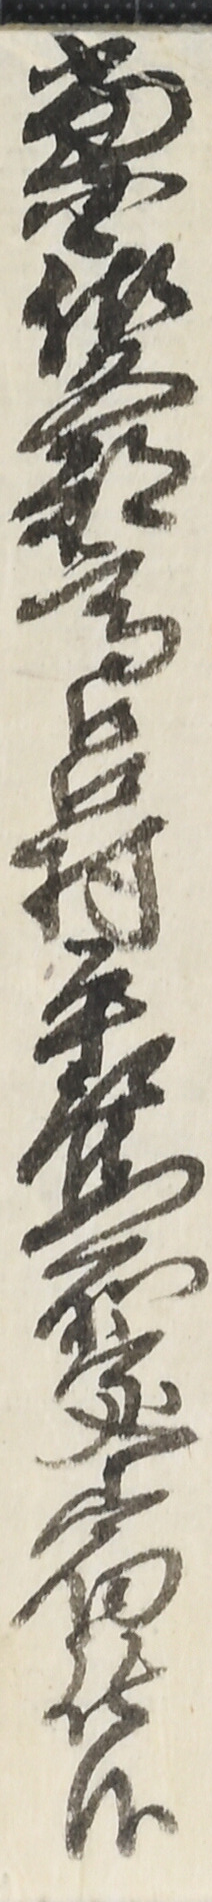当国佐久郡高呂村平左衛門所定宿仕候
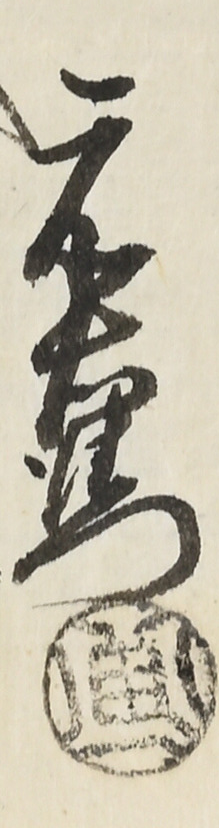元右衛門㊞
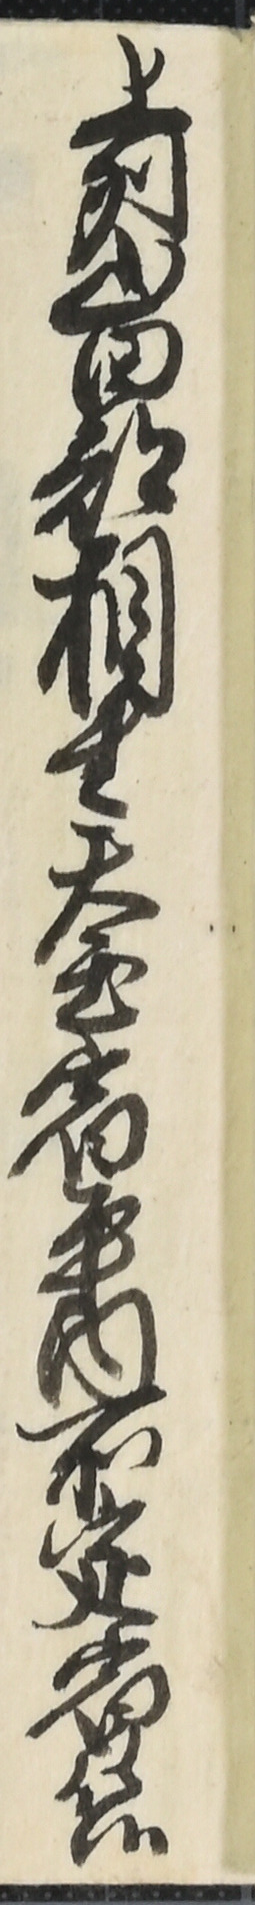上州山田郡相生天王宿平内所定宿仕候
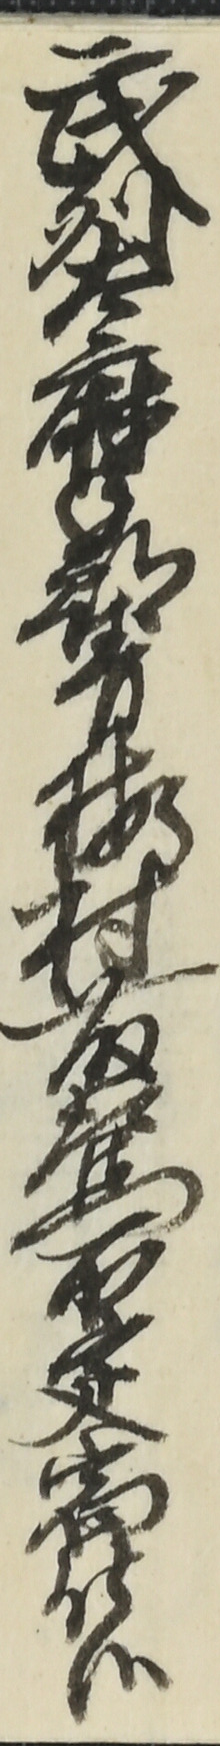武州太摩郡青梅村藤左衛門所定宿仕候

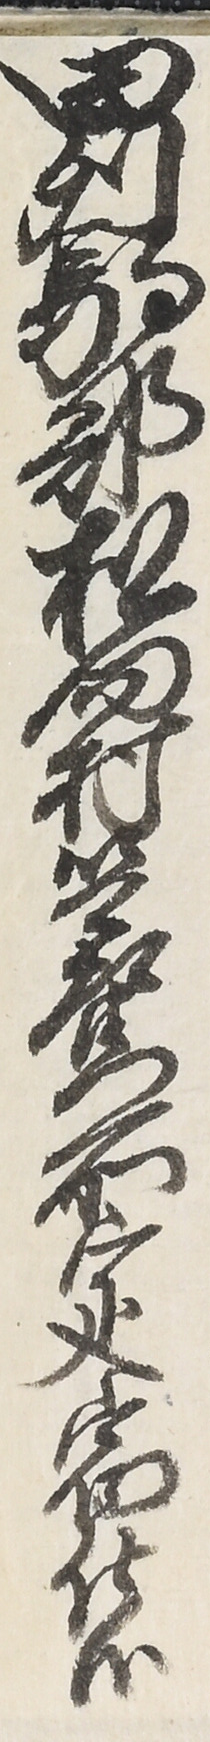甲州駒郡松向村兵左衛門所定宿仕候
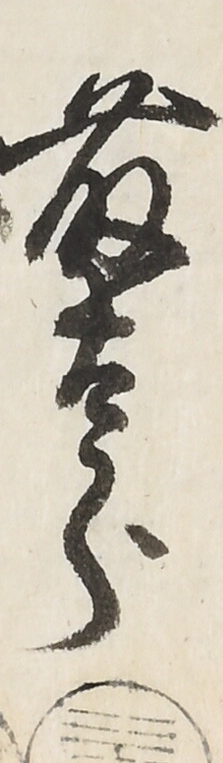藤太郎
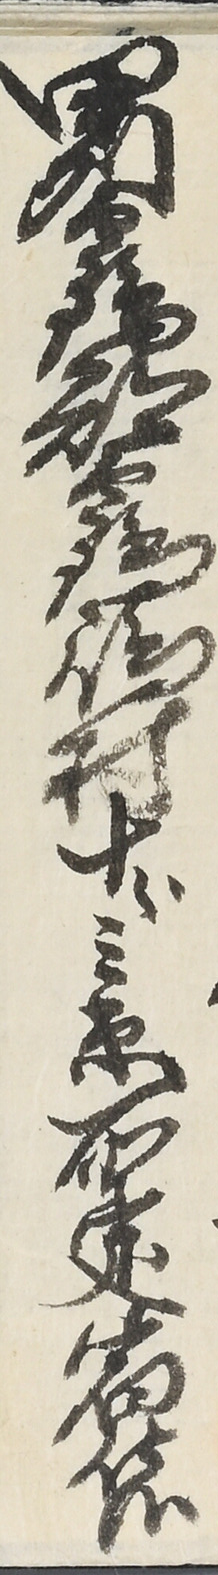甲州鶴郡鶴島村十郎兵衛所定宿仕候

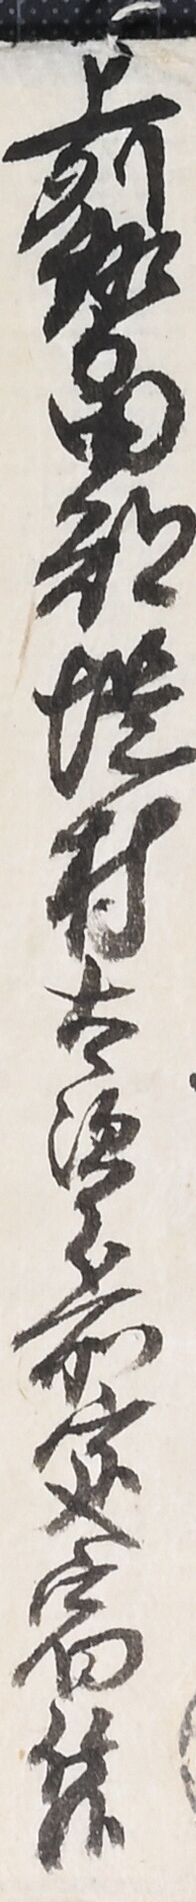上州勢田郡堤村太次郎所定宿仕候
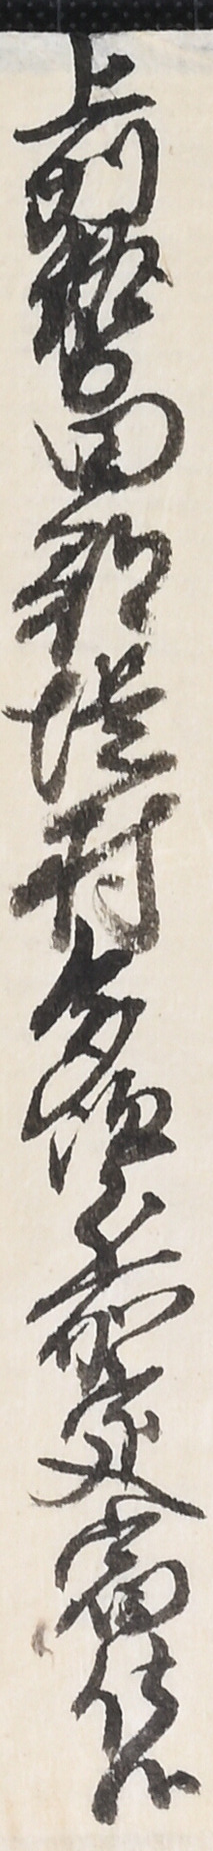上州勢田郡堤村多次郎所定宿仕候
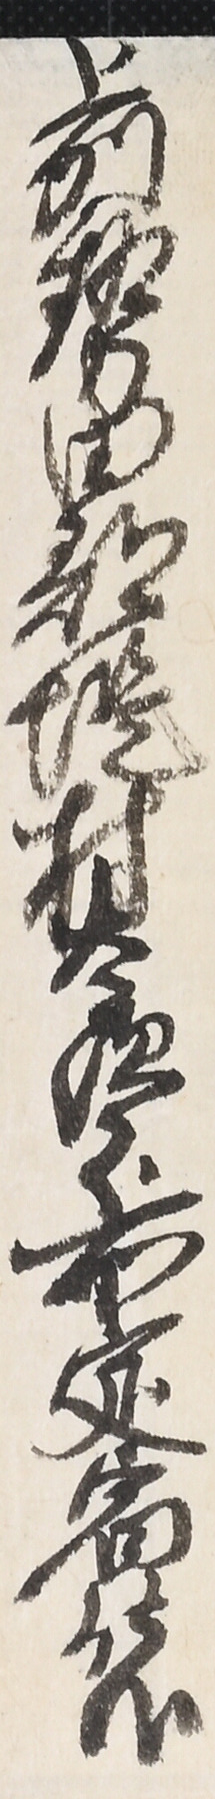上州勢田郡堤村太次郎所定宿仕候
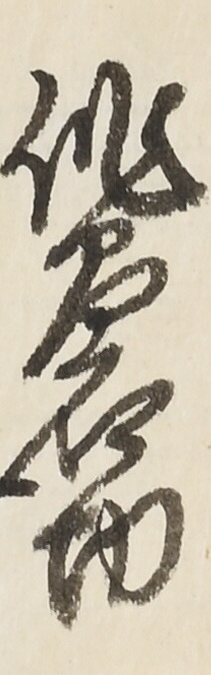作間石切

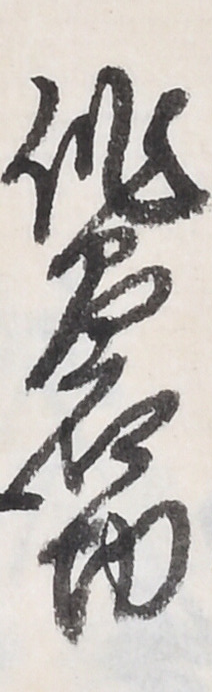作間石切
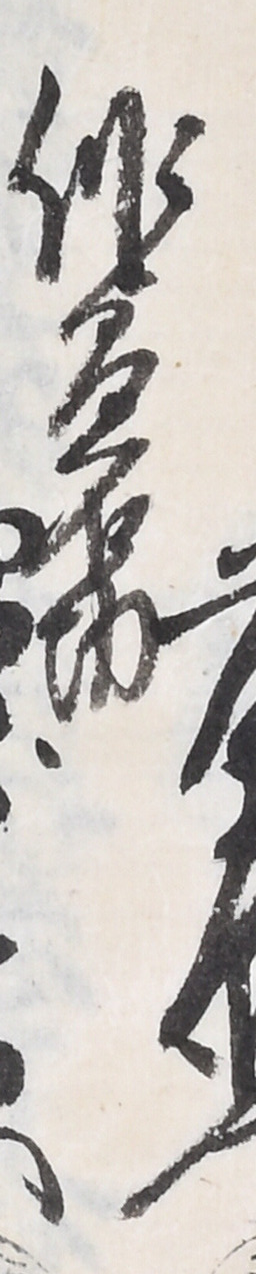作間石切
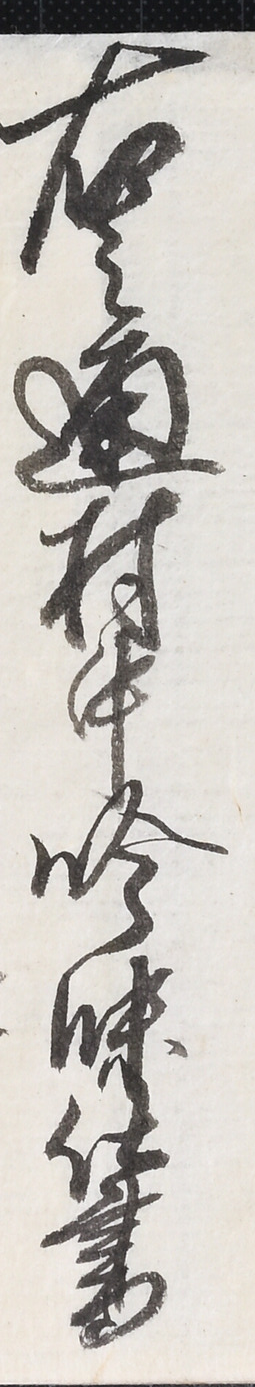右之通村中吟味仕書
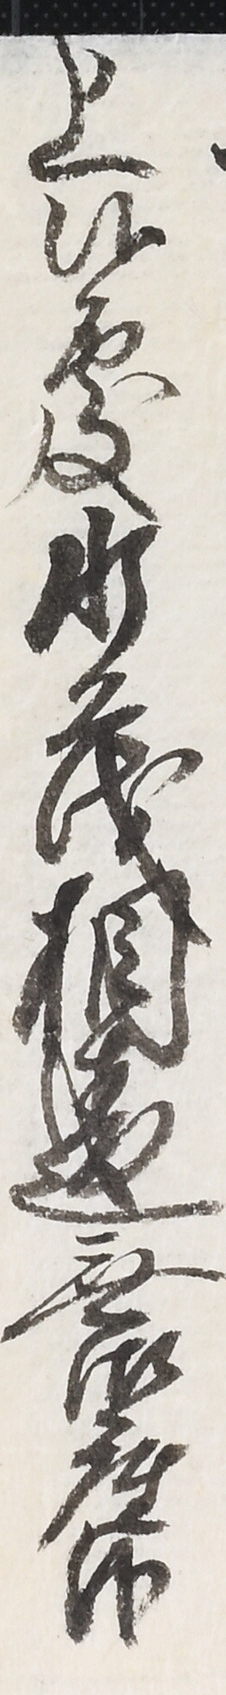上候処少も相違無御座候
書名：安政六己未年正月日他國出石切名前書上帳
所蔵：伊那市立高遠町図書館・合同会社AMANE
